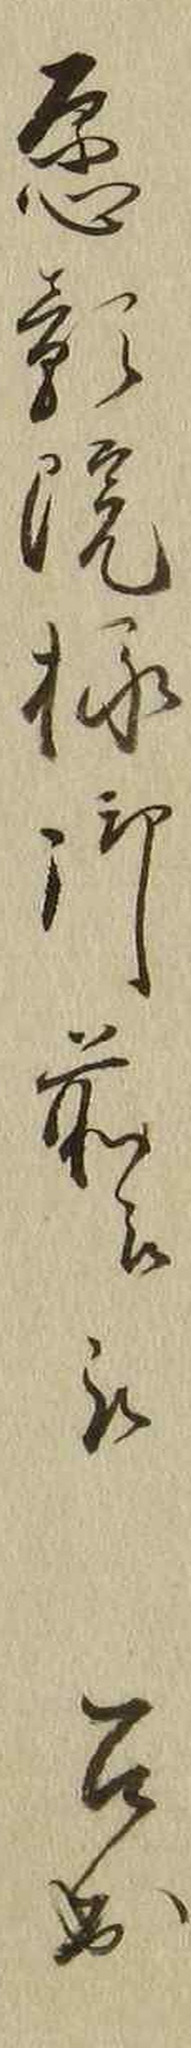愿彰院様御前江被召出
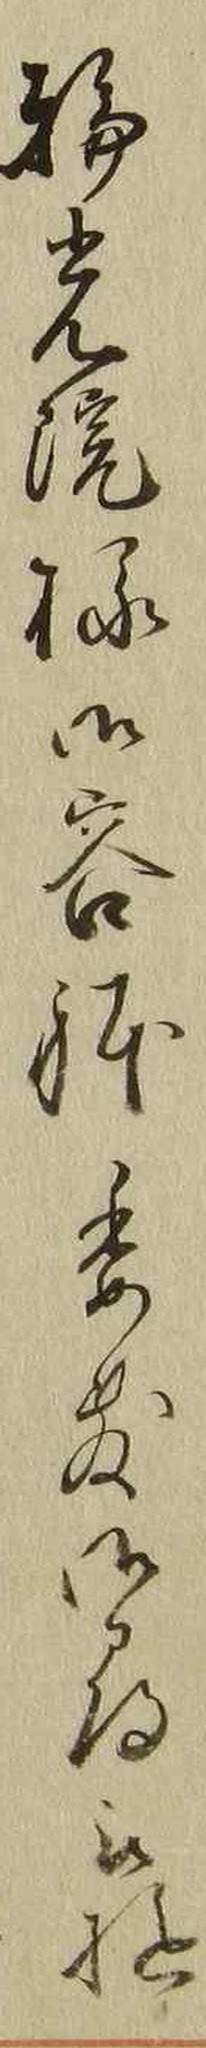輪光院様御容体委敷御尋被遊
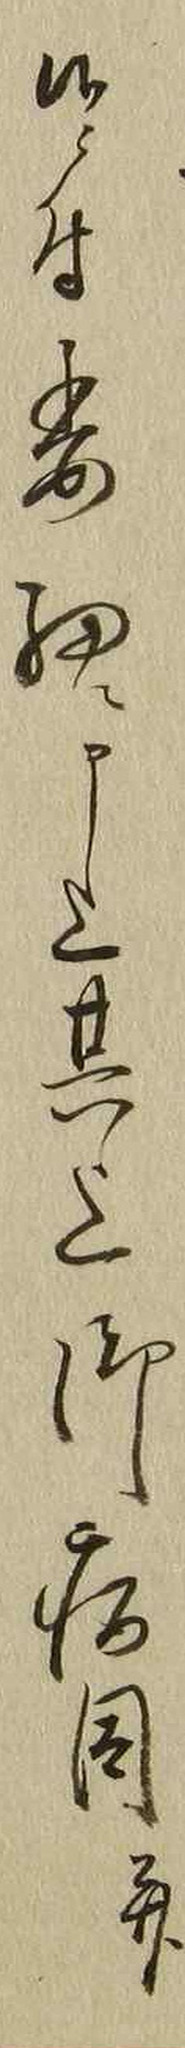候ニ付委細ニ申上其上御病因并
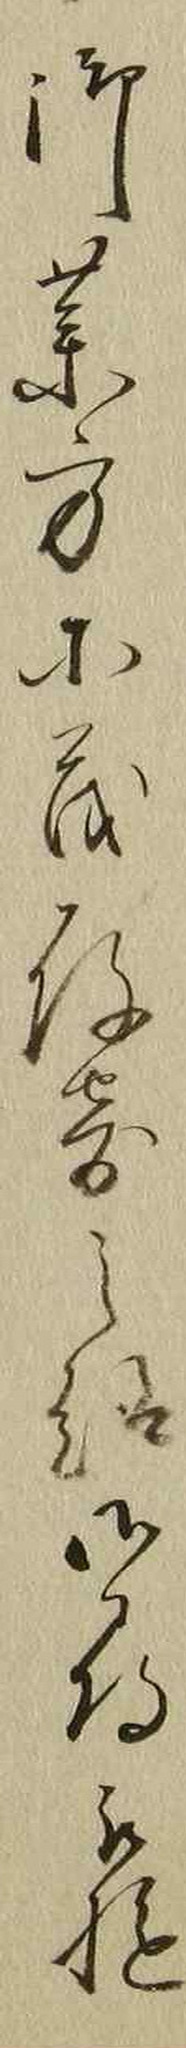御薬方等も存寄之趣御尋被遊
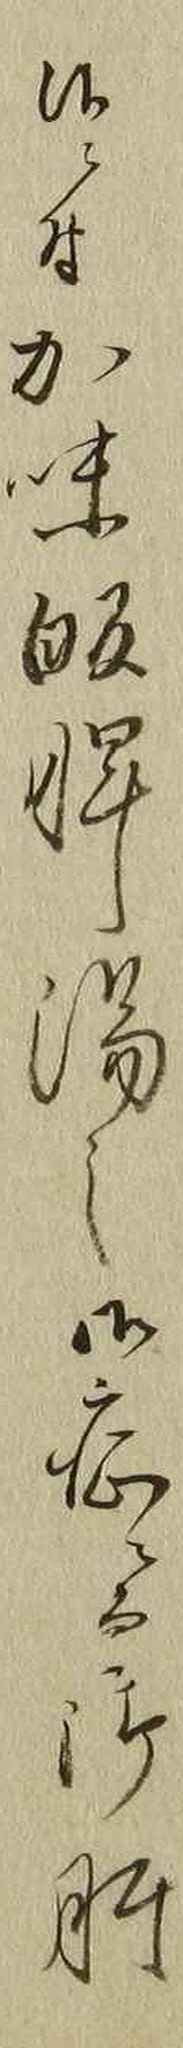候ニ付加味帰脾湯之御症ニ而御肝
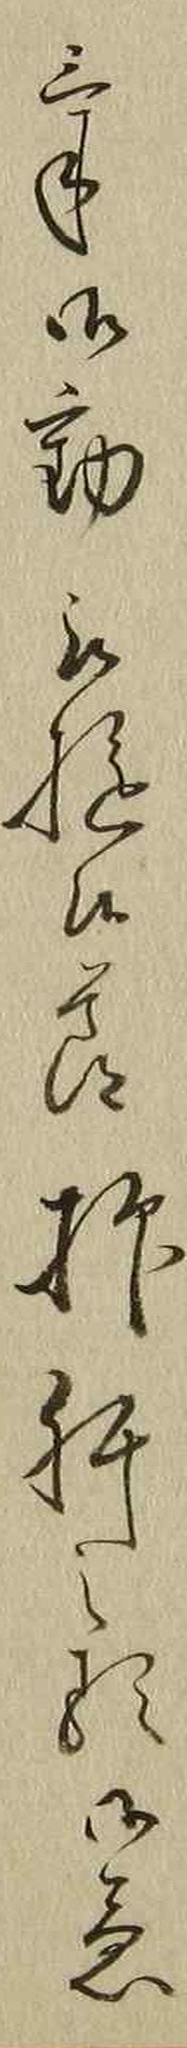気御動被遊候節抑肝之類御急
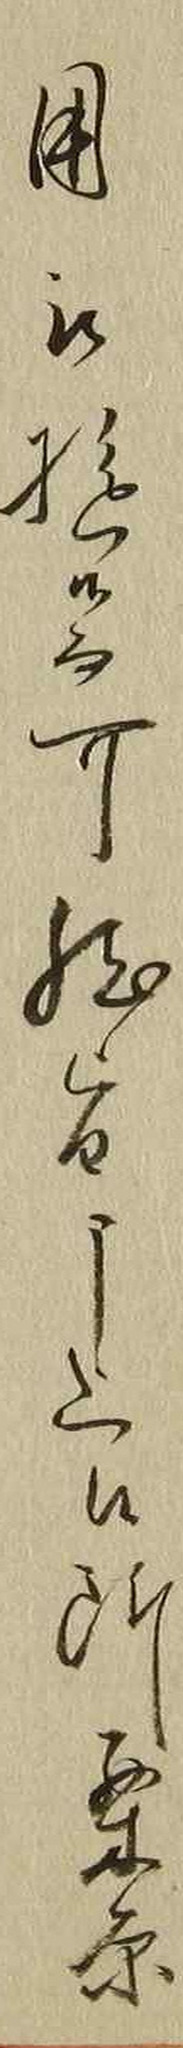用被遊候而可然旨申上候所栗原
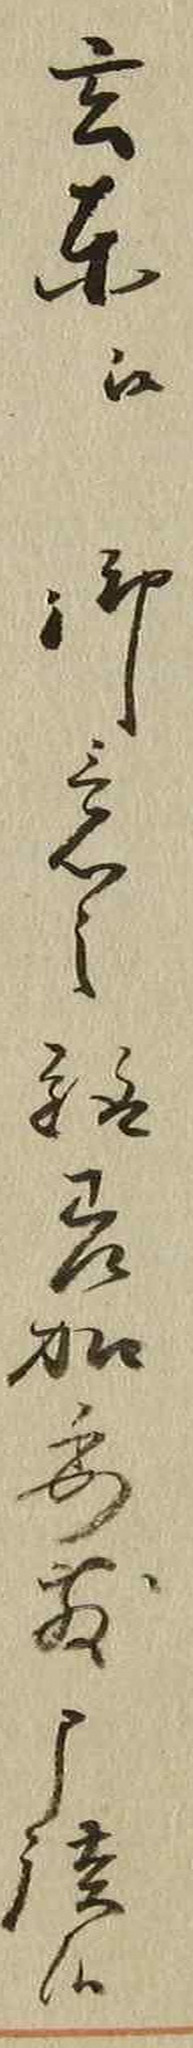玄東江御意之趣差加委敷申談候
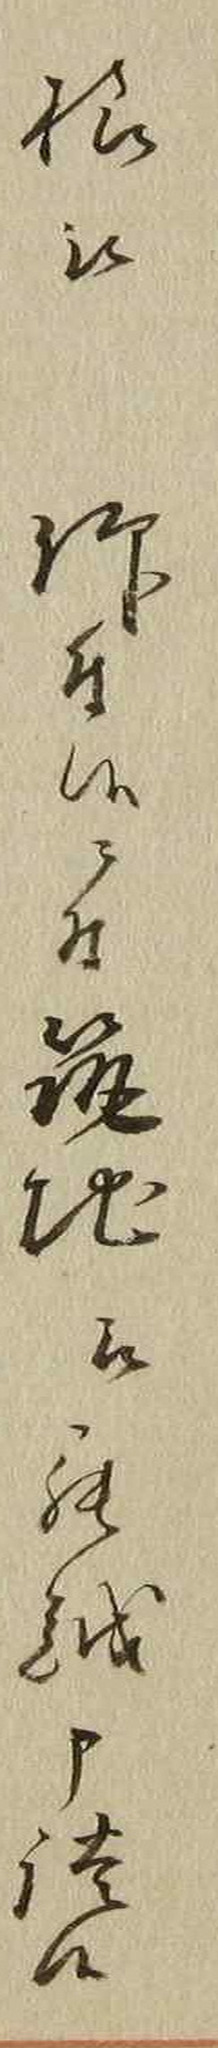様被仰付候ニ付筑地江罷越申談候
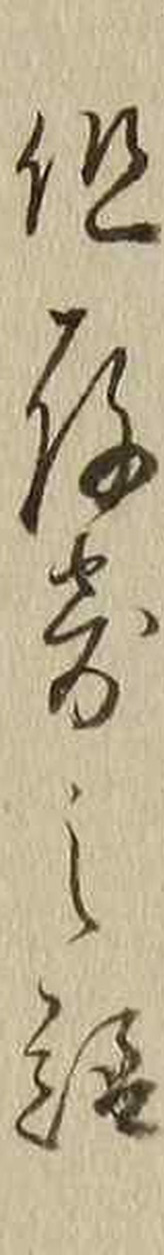但存寄之趣
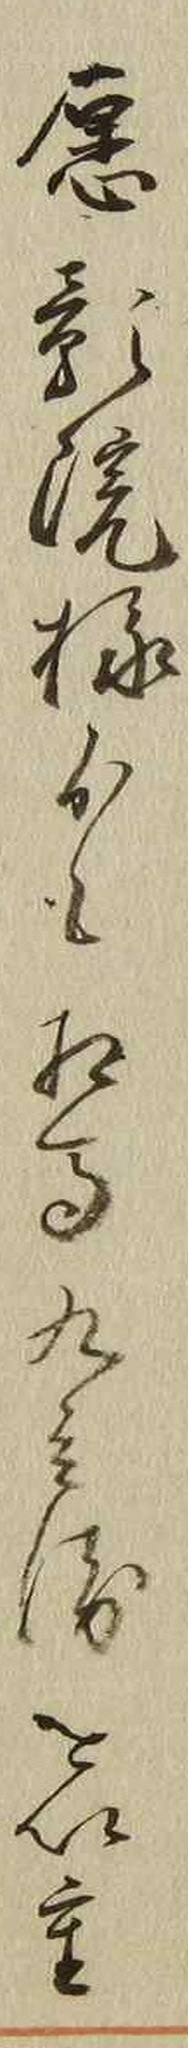愿彰院様ゟも相馬九兵衛を以重
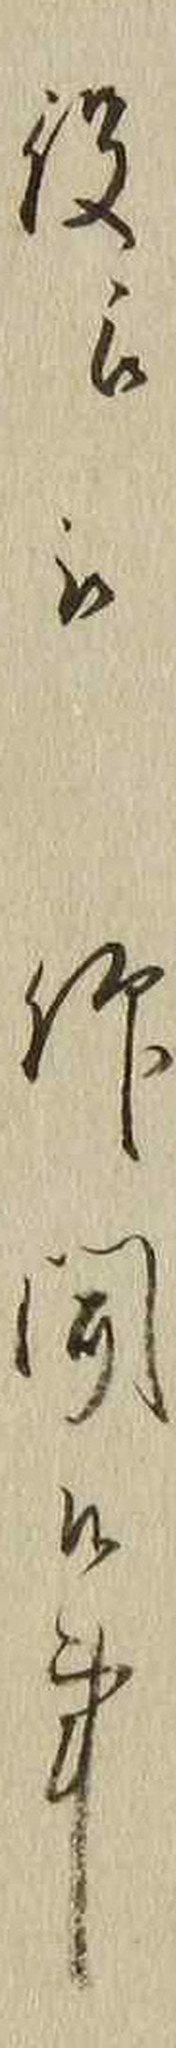役江被仰聞候事
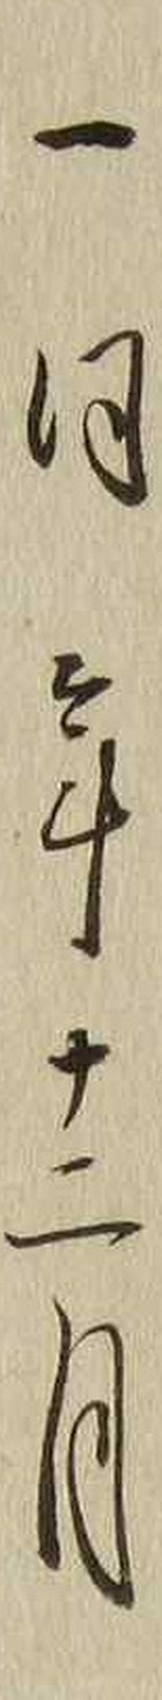一同年十二月
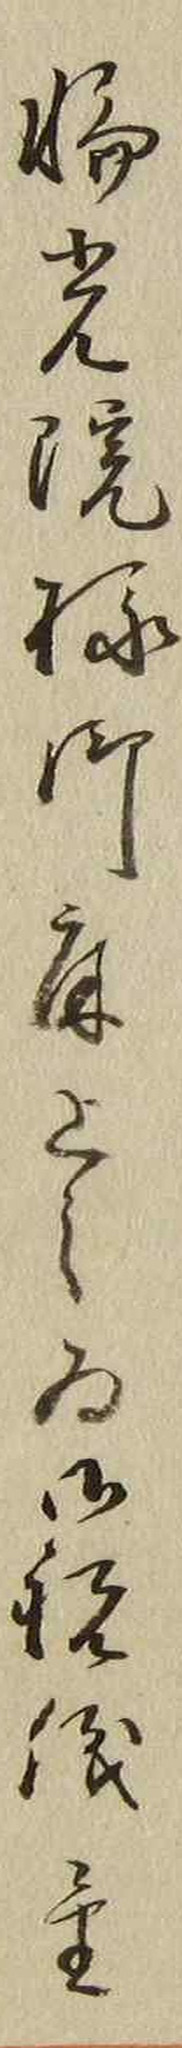輪光院様御床上之為御祝儀金
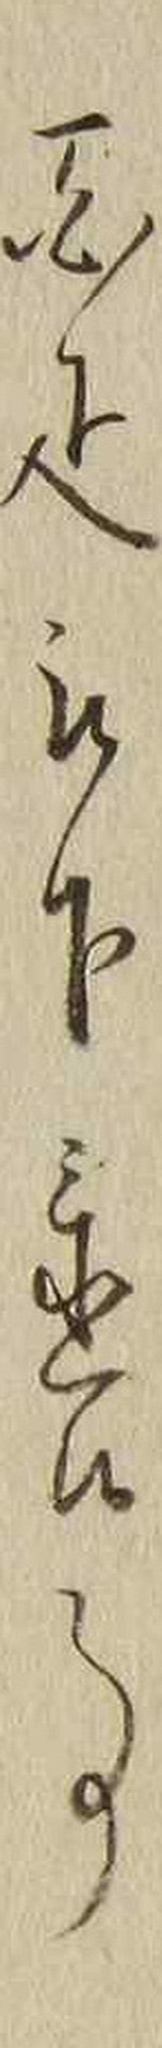百疋被下置候事
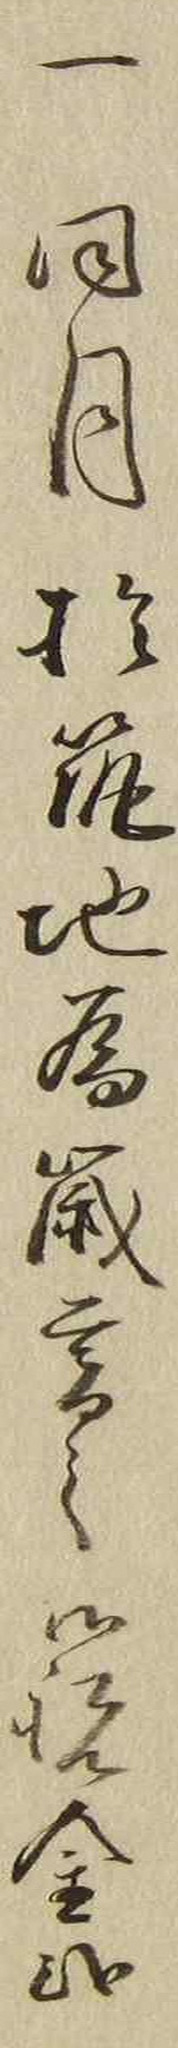一同月於築地為歳暮之御祝金弐
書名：諸士系譜　巻之68　を之部2
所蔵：会津若松市立会津図書館
